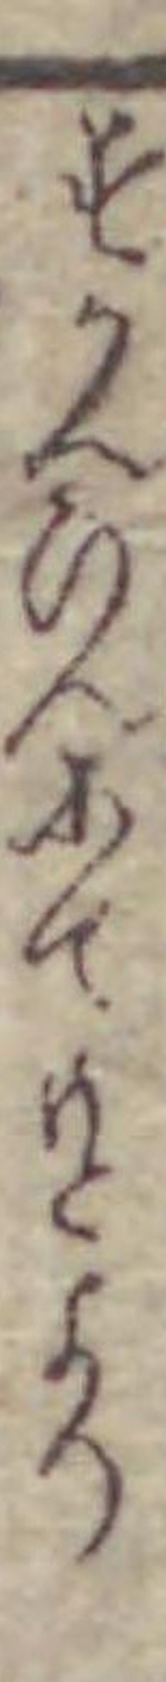すかんひんにてもとより
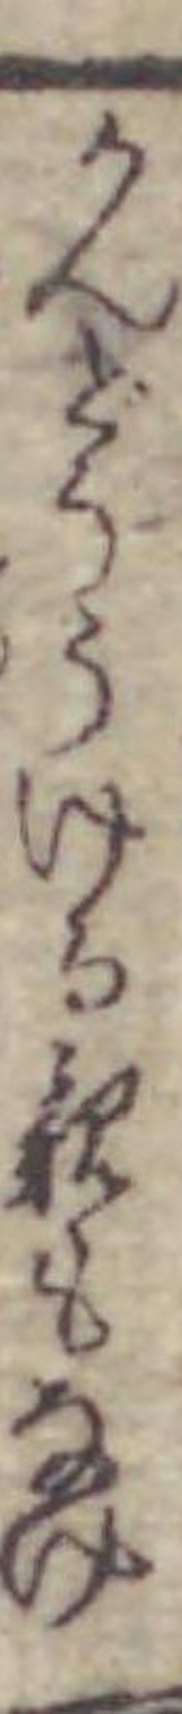かんどううける親もなけ
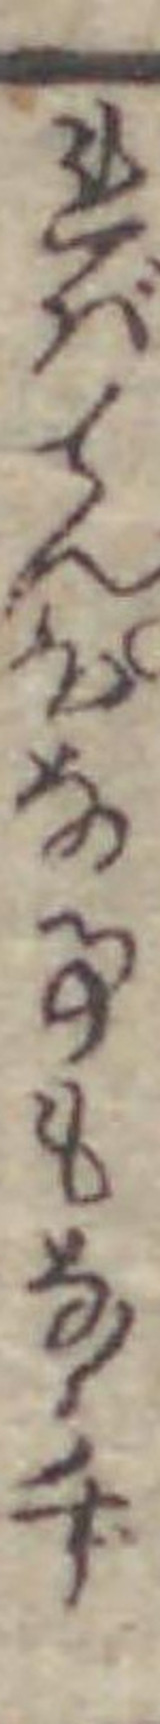ればんぽな事もならず
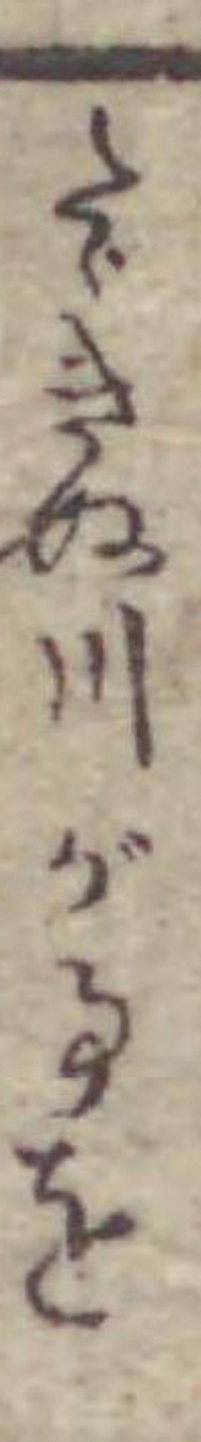ただきぬ川が事を
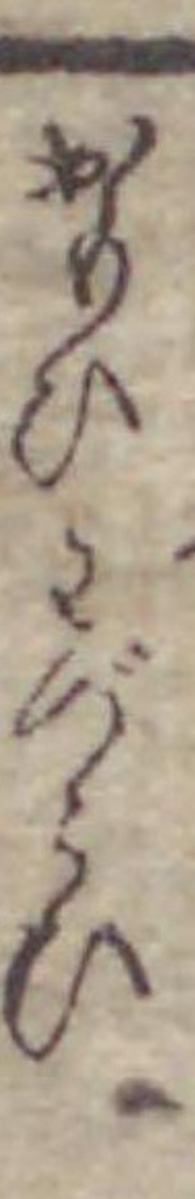おもひわづらひ
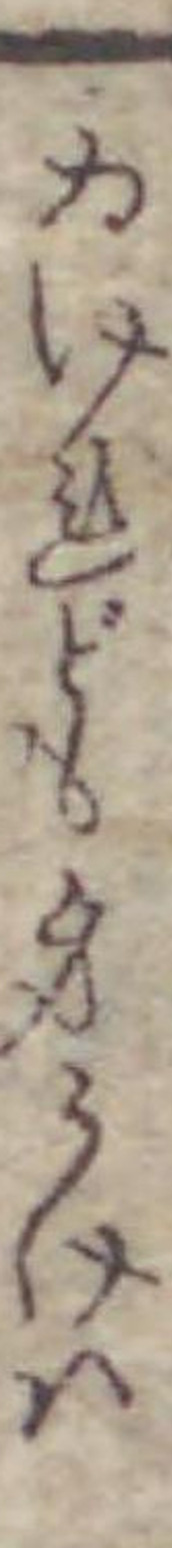ゐけれども身うけは
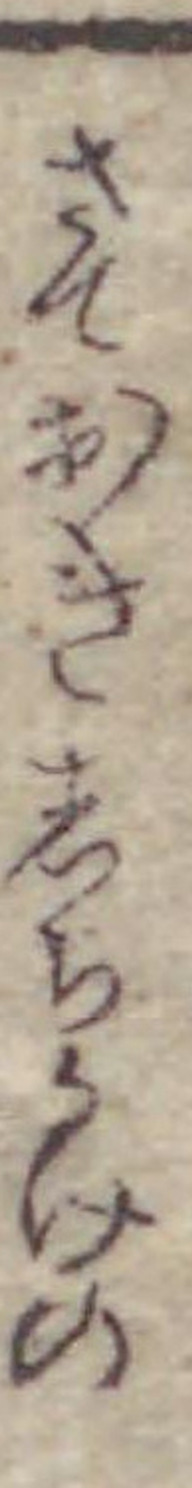さておきしちうけの
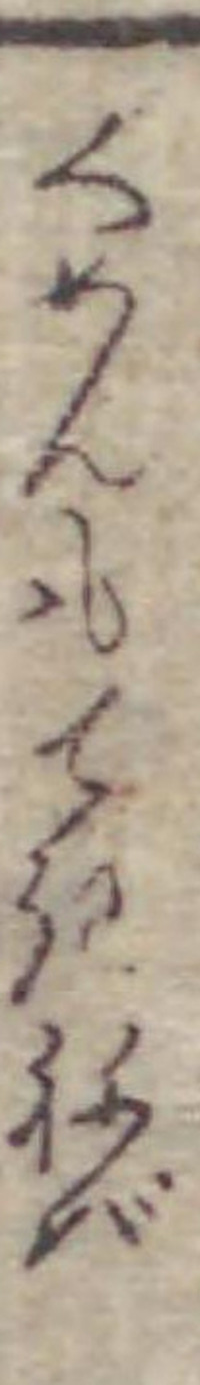くめんもてきねば
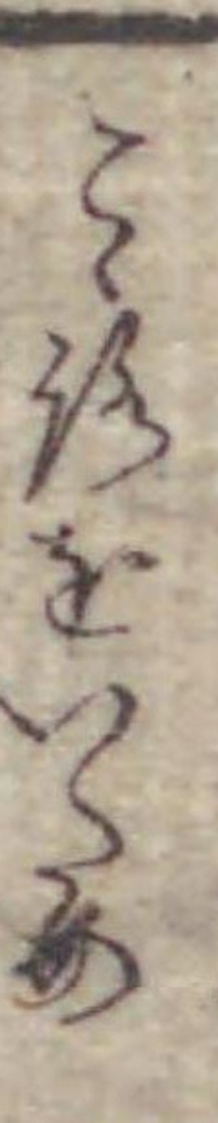こゝろをいため
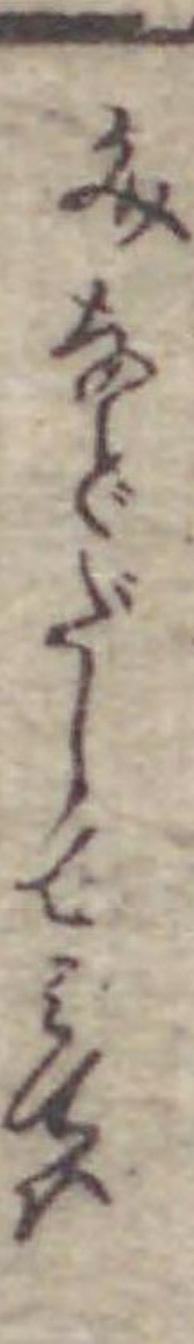文などだしてみては
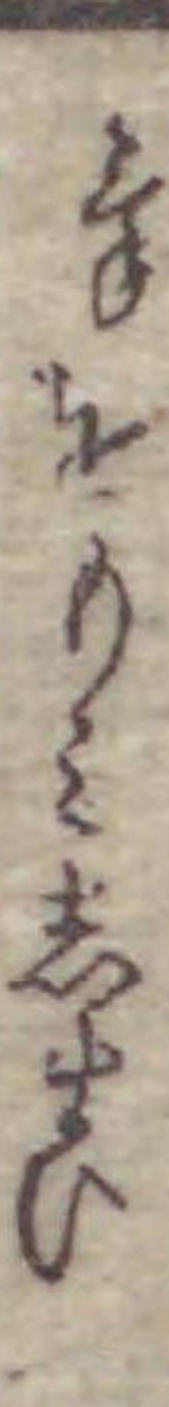気をもみしまひ
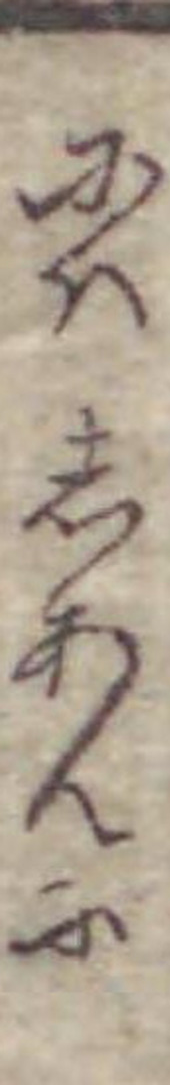にはしあんに
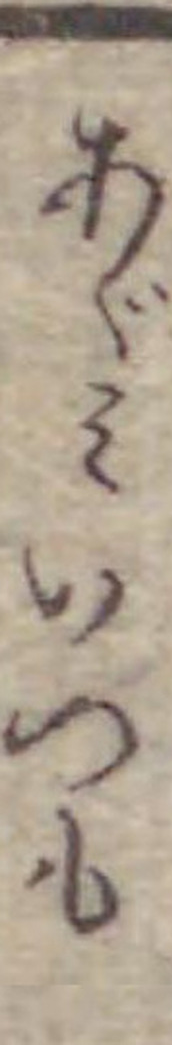あぐみいつも
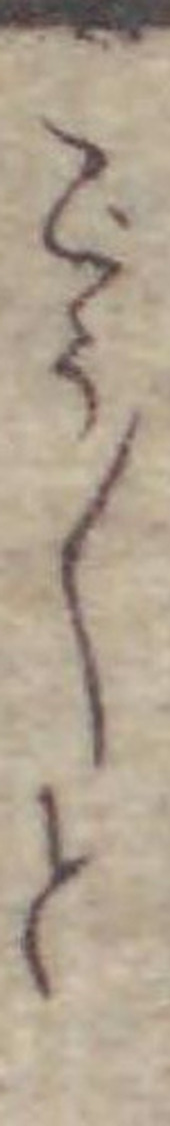こう〳〵と
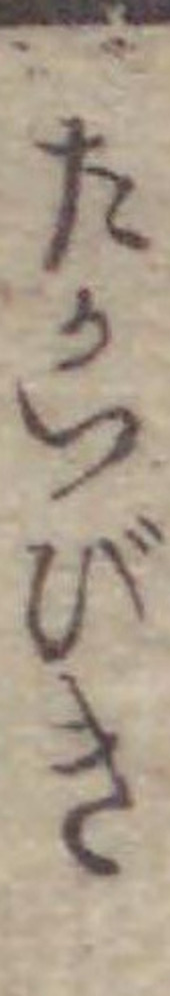たかいびき
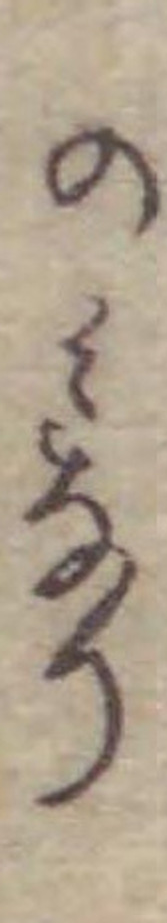のみなり
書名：嗚呼不侭世之助噺 : 3巻
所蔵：国立国会図書館 National Diet Library, JAPAN
